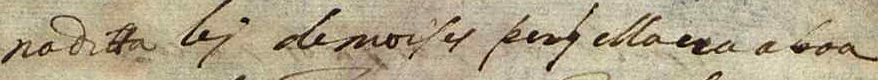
na ditta lej de moises porq̄ ella era a boa
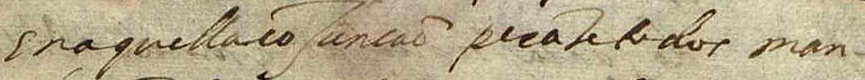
E naquella cōJunçaõ perāte todos man
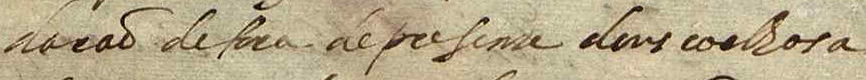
daraõ de fora de presente dous coelhos a
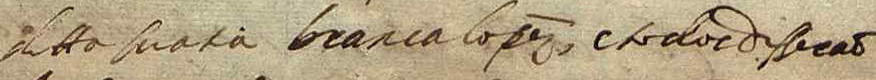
ditta sua tia branca lopēz, e todos disseraõ
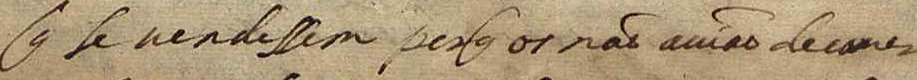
q̄ se uendessem porq̄ os naõ auiaõ de comer
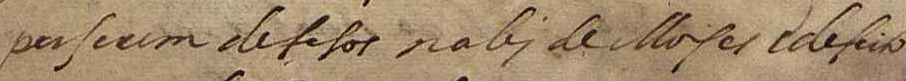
por serem defesos na lej de Moises e de feito
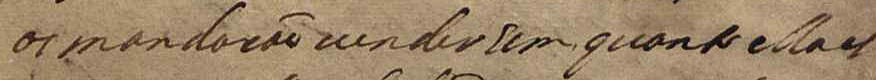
os mandaraõ uender E em quanto ella es
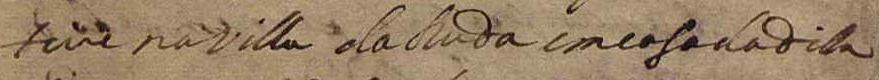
teue na Villa daRuda em casa da ditta
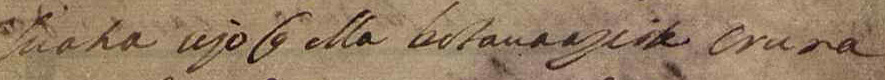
sua tia ujo q̄ ella botaua azeite cru na
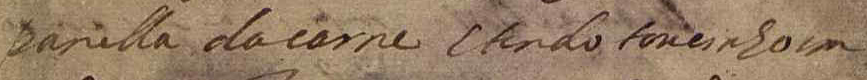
panella da carne E tendo toucinho em
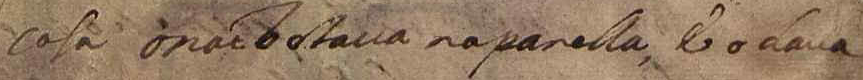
casa o naõ botaua na panella, E o daua
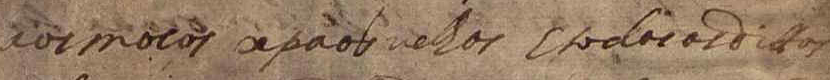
aos mocos xpaos uelhos E todas as dittas
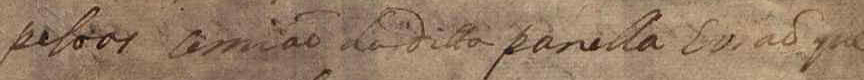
pesoas comiaõ da ditta panella E viaõ que
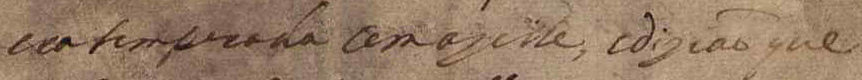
era temperada com azeite, e dizião que
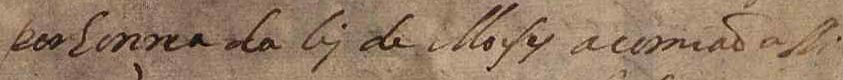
por honrra da lej de Moises a comiaõ assi
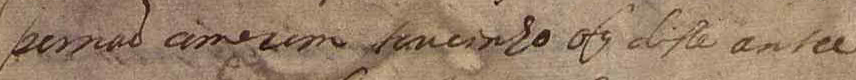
per naõ comerem toucinho o q̄ disse antre
